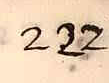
222
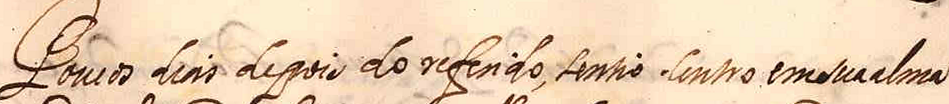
Poucos dias depois do referido, sentio dentro em sua alma
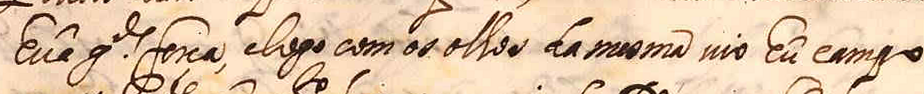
huā g.de força, e logo com os olhos da mesma uio hū campo
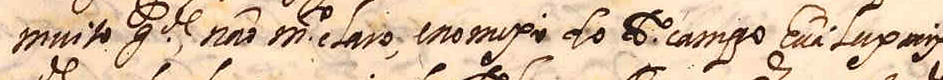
muito g.de não m.to claro, e no meyo do d̄.o campo huā Lux muy
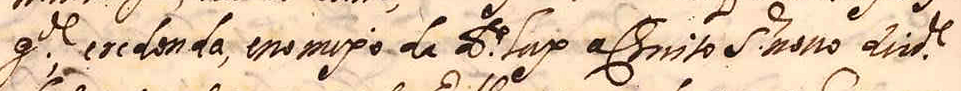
g.de, e redonda, e no meyo da d̄.a Lux a Christo S.or nosso de id.e
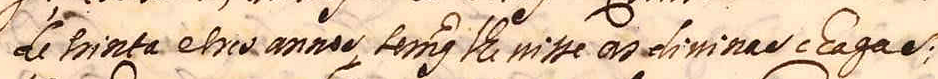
de trinta e tres annos, sem q̄ lhe uisse as diuinas chagas;
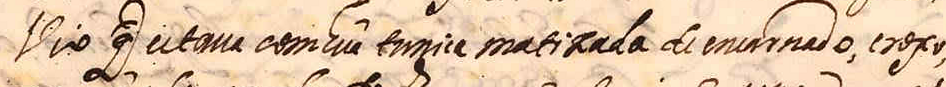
Vio q̄ estaua com huā tunica matizada de encarnado, e roxo,
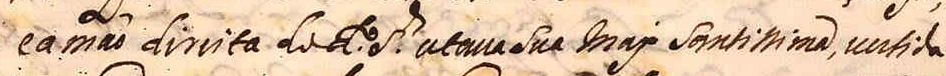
e a maõ direita do d̄.o S.or estaua sua May Santissima, uestida
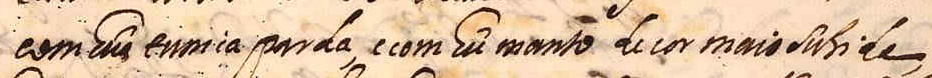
com hūa tunica parda, e com hū manto de cor mais subida,
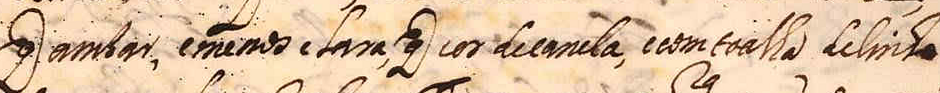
q̄ ambar, e menos clara, q̄ cor de canela, e com toalha de linho
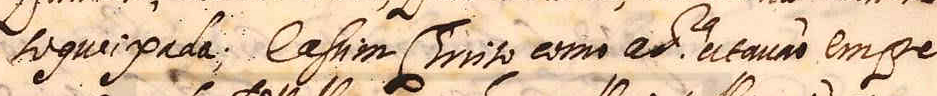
so queixada. E assim Christo como a s.ra estauão em pé
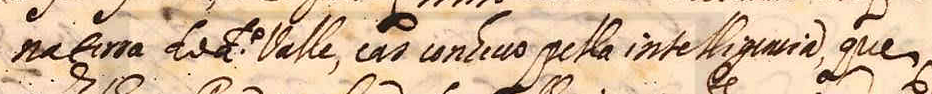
na terra do d̄.o Valle, e as conheceo pella intelligencia, que
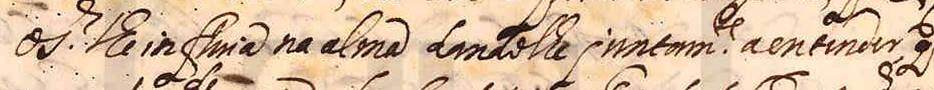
o s.or lhe influia na alma dandolhe juntam.te a entender q̄
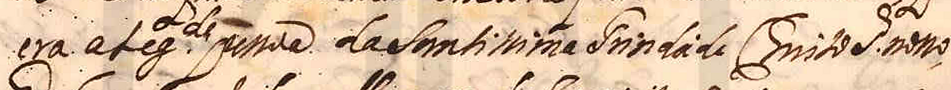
era a seg.da pessoa da Santissima Trindade Christo S.or nosso,
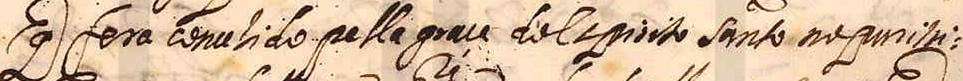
q̄ fora concebido pella graça do Espirito Santo no purissi
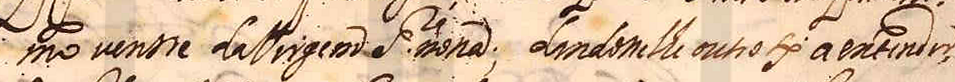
mo uentre da Virgem S.ra nossa; dandosselhe outrosy a entender,
